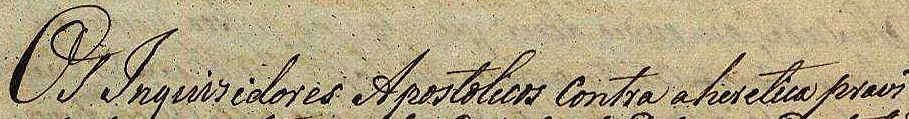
Os Inquisidores Apostolicos contra a heretica provi
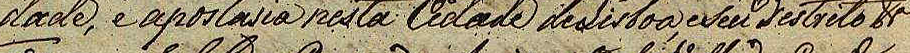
dade, e apostasia nesta Cidade de Lisboa, e seu destrito &ra
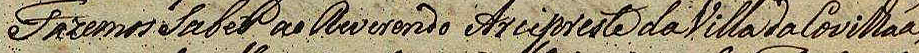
Fazemos saber ao Reverendo Arcipreste da Villa da Covilhaã,
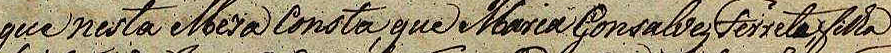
que nesta Meza consta, que Maria Gonçalvez Ferrete, filha
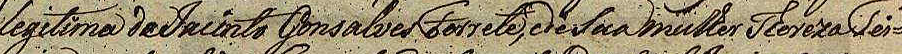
legitima de Iacinto Gonsalves Ferrete, e de sua mulher Thereza Tei
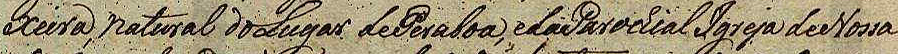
xeira, natural do lugar de Peraboa, e da Parochial Igreja de Nossa
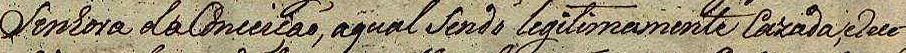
Senhora da Conceiçaõ, a qual sendo legitimamente cazada, e Rece
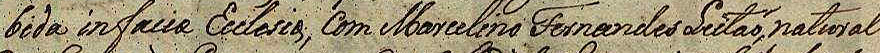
bida in facia Ecclesia, com Marcelino Fernandes Leitaõ, natural
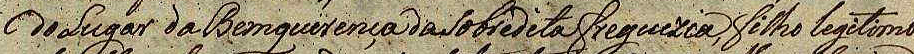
do lugar de Bemquerença da sobredita freguezia, filho legitimo
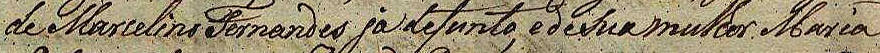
de Marcelino Fernandes ja defunto, e de sua mulher Maria
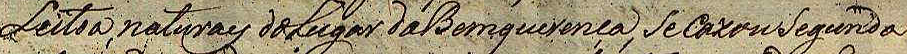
Leitoa, naturaes do Lugar de Bemquerença, se cazou segunda
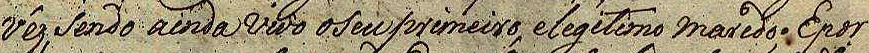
vêz, sendo ainda vivo o seu primeiro, e legitimo marido; E por
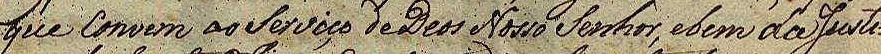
que convem ao serviço de Deos Nosso Senhor, e bem da Justi
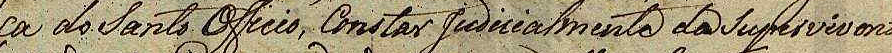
ça do Santo Officio, constar judicialmente da superviven
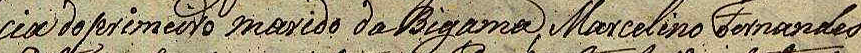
cia do primeiro marido da Bigama, Marcelino Fernandes
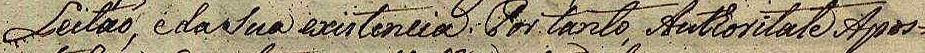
Leitaõ, e da sua existencia. Portanto, Authoritate Apos
